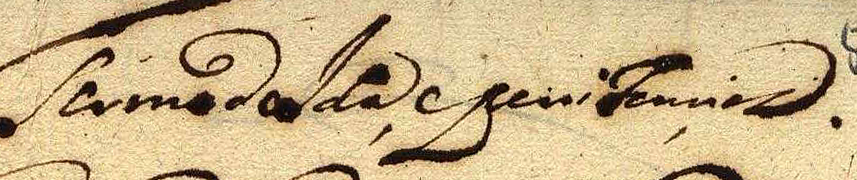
Termo de Ida, e penitencias.
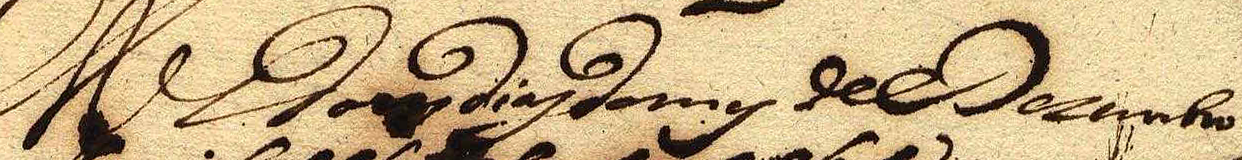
Aos dous dias do mes de Dezembro
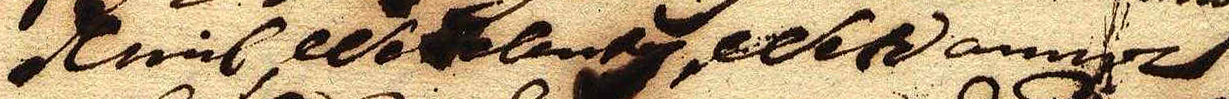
de mil, e setecentos, e sete annos
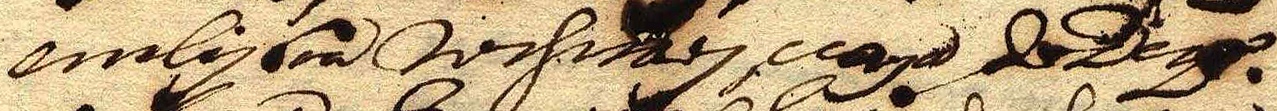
em lisboa nos estaos e caza do Despo.
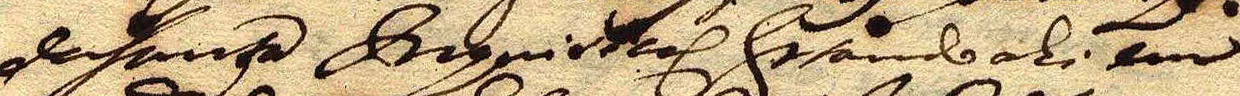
da santa Inquisiçaꝭ Estando ahi em
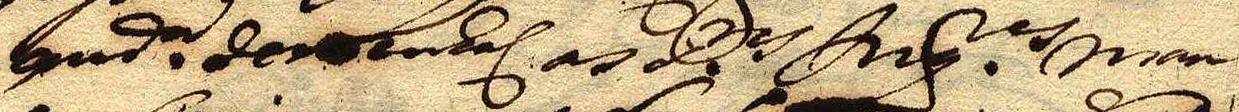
aud.a de menhaꝭ os S.res Inq.res man
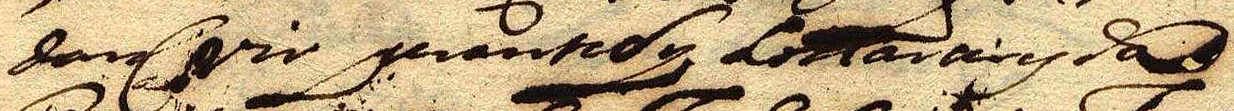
daraꝭ vir perante sy dos Carceres da
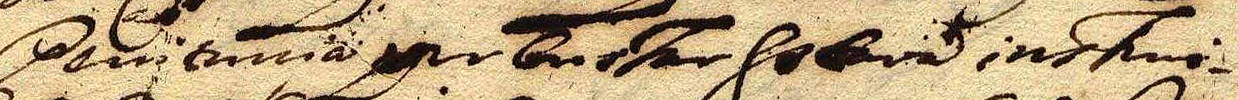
penitencia por Constar Estava intrui
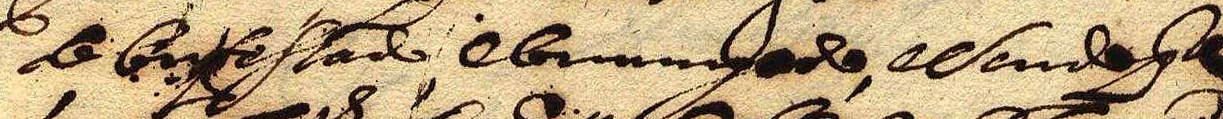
do Confessado, e comungado, e Sendo pRe
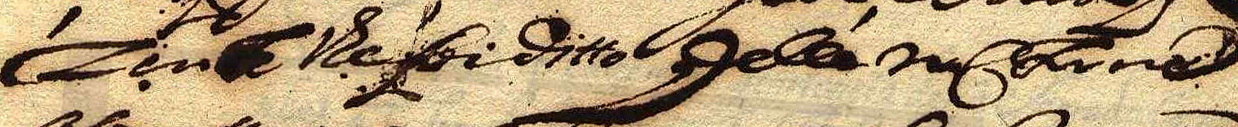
Zente lhe foi ditto q̄ elle naꝭ tornou
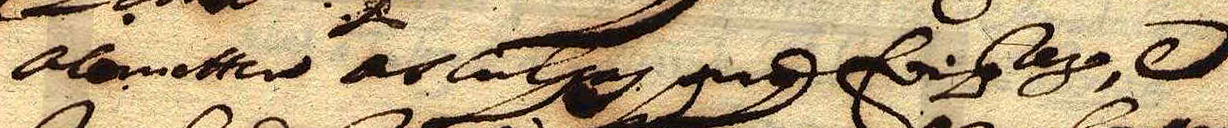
a cometter as culpas porq̄ foi pRezo, e
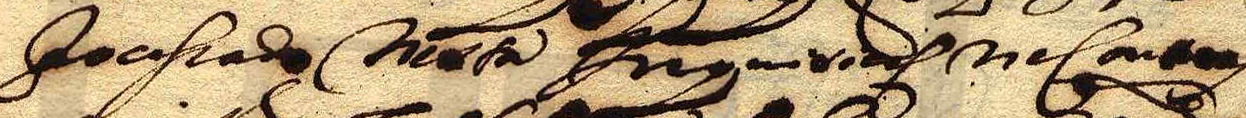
pRocessado nesta Jnquisiçaꝭ nē outras
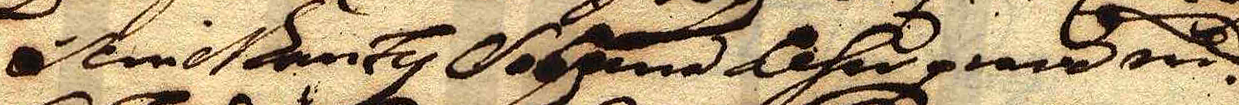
semelhantes Sob pena de ser gravem.te
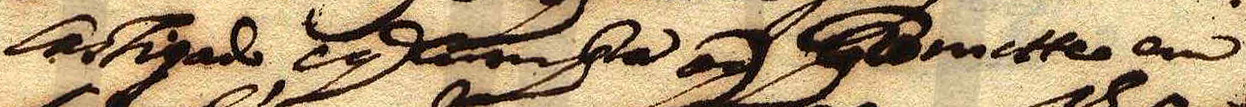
Castigado e q̄ cumpRa o q̄ pRometteo em
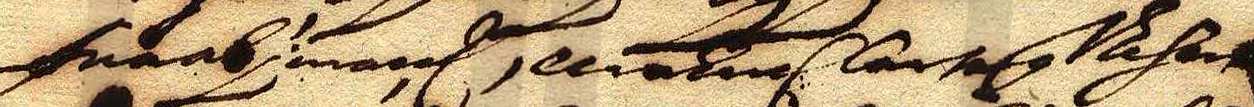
sua abjuraçaꝭ, e em huā carta q̄ lhe ser_
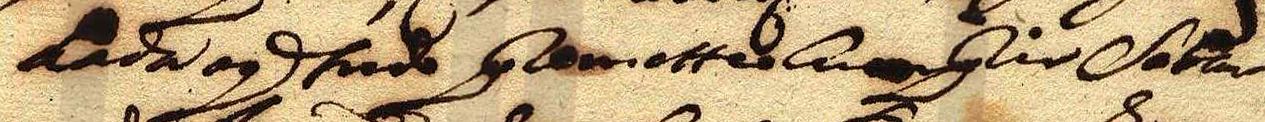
dada o q̄ tudo pRometteo cumprir Sob car
